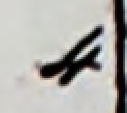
4
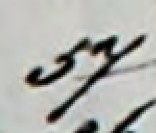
57
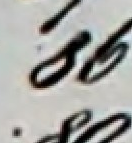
36
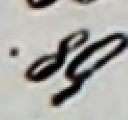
89
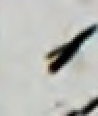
1
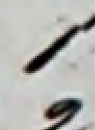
1
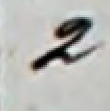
2
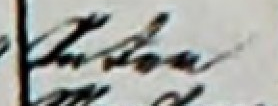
An der
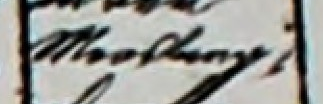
Moosberg
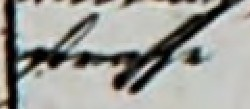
st?asse
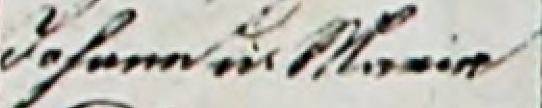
Johann u. Maria
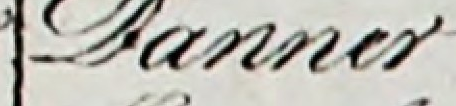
Danner
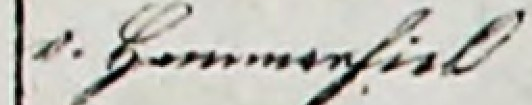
v. Hammersiel
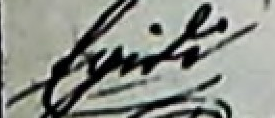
Egidi
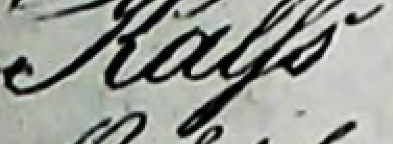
Kalss
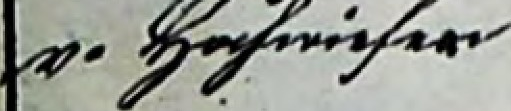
v. Hochwieser
